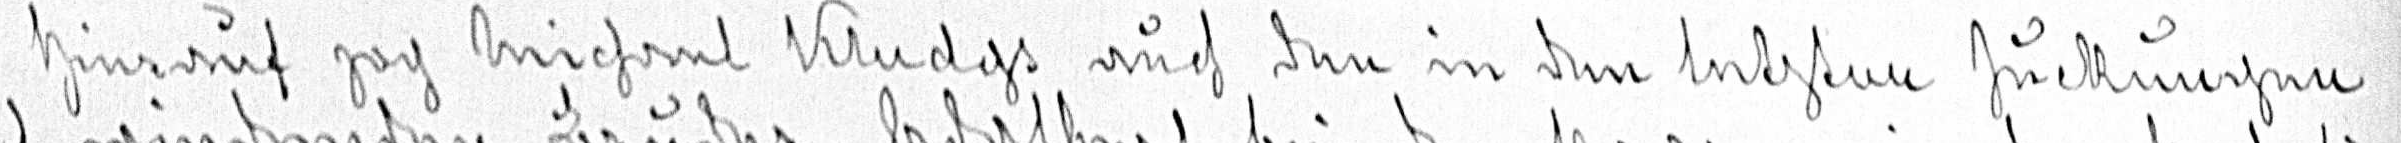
Hierauf zog Michael Kludys auch den in den letzten Zuckungen
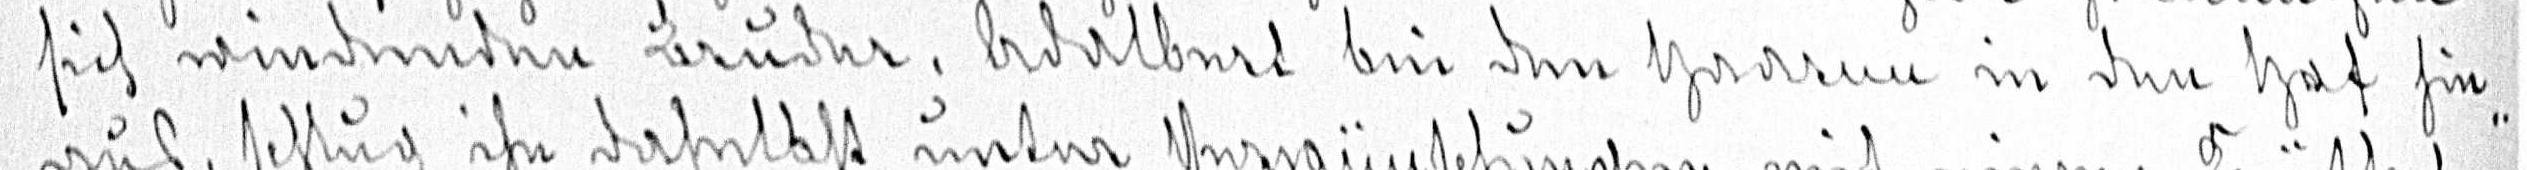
sich windenden Bruder, Adalbert bei den Haaren in den Hof hin¬
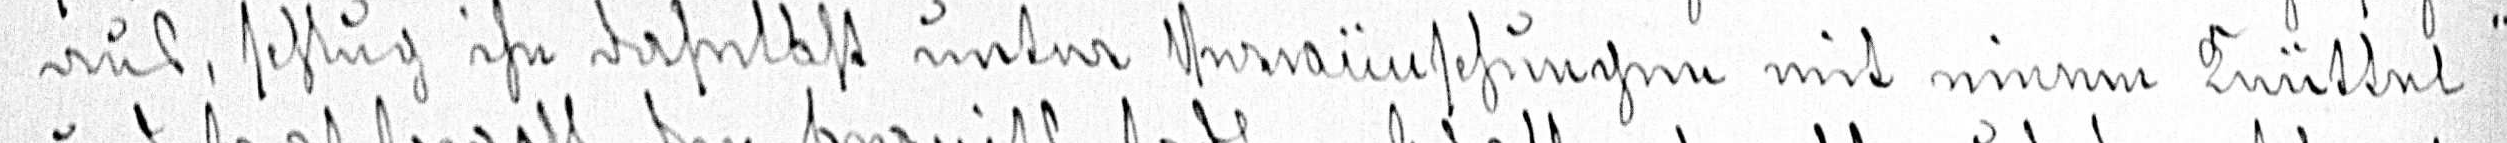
aus, schlug ihn daselbst unter Verwünschungen mit einem Knüttel
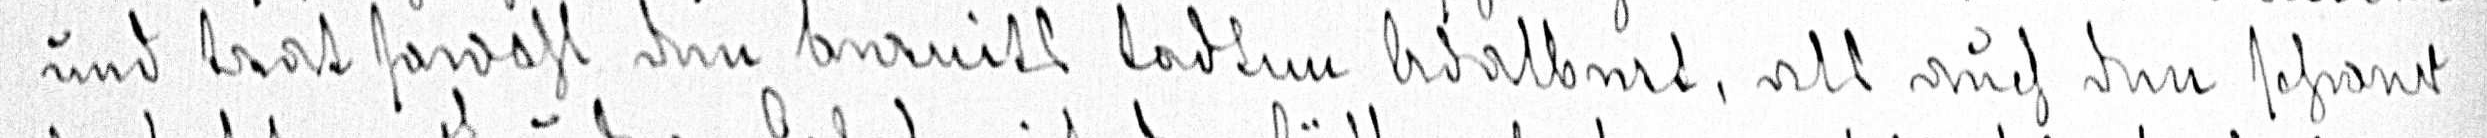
und trat sowohl den bereits todten Adalbert, als auch den schwer
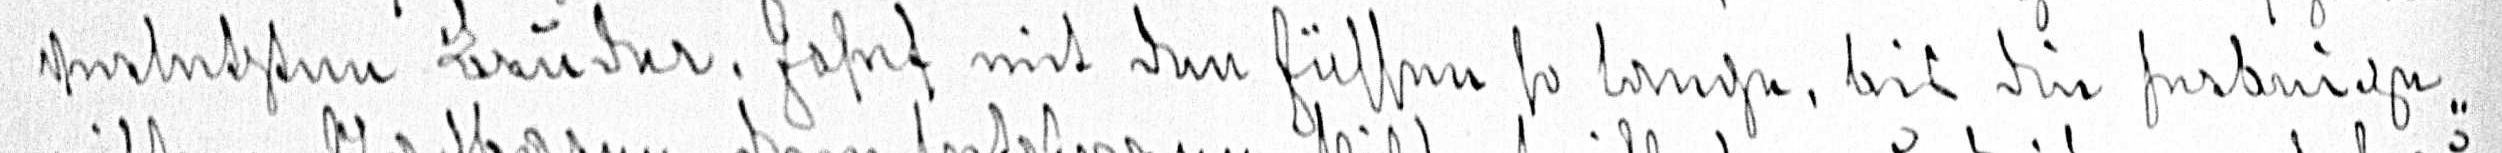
verletzten Bruder, Josef mit den Füssen so lange, bis die herbeige¬
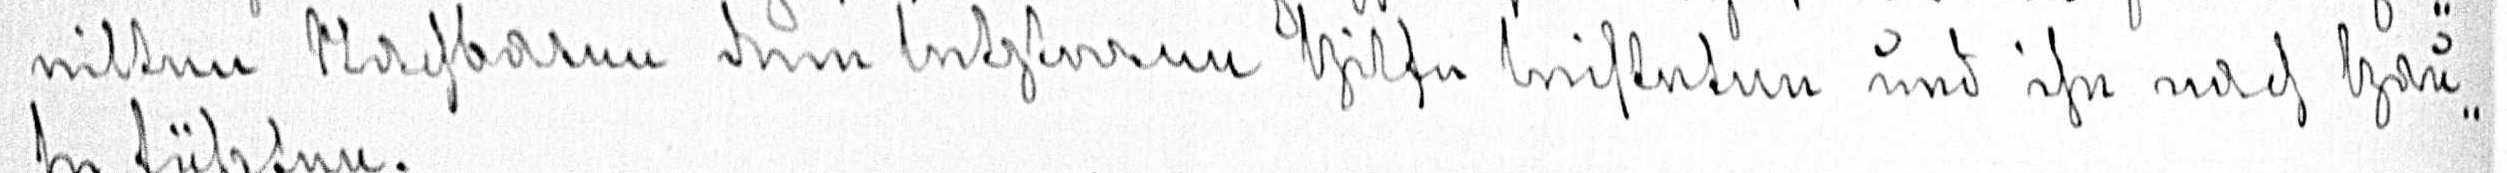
eilten Nachbaren dem letzteren Hilfe leisteten und ihn nach Hau¬
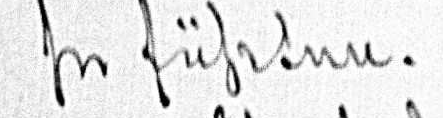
se führten.
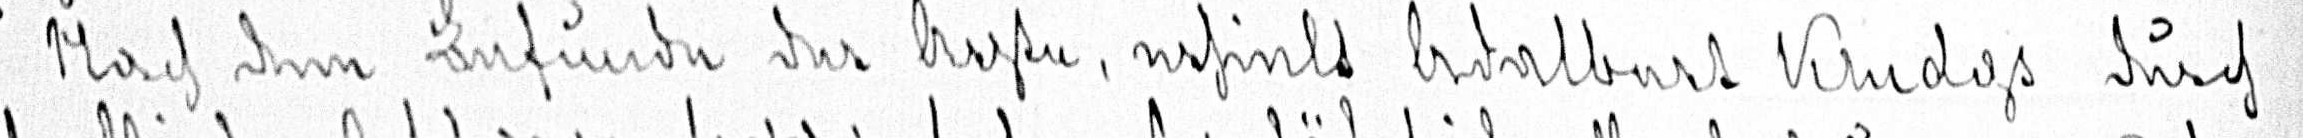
Nach dem Befunde der Aerzte, erhielt Adalbert Kludys durch
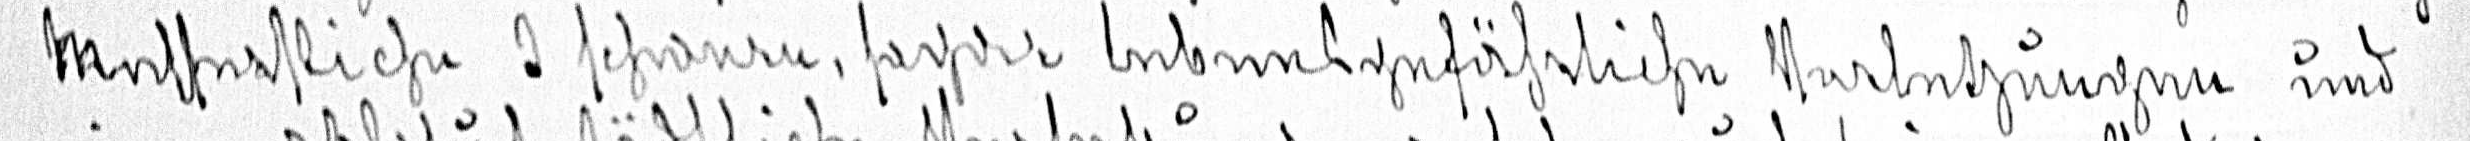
Messerstiche 3 schwere, sogar lebensgefährliche Verletzungen und
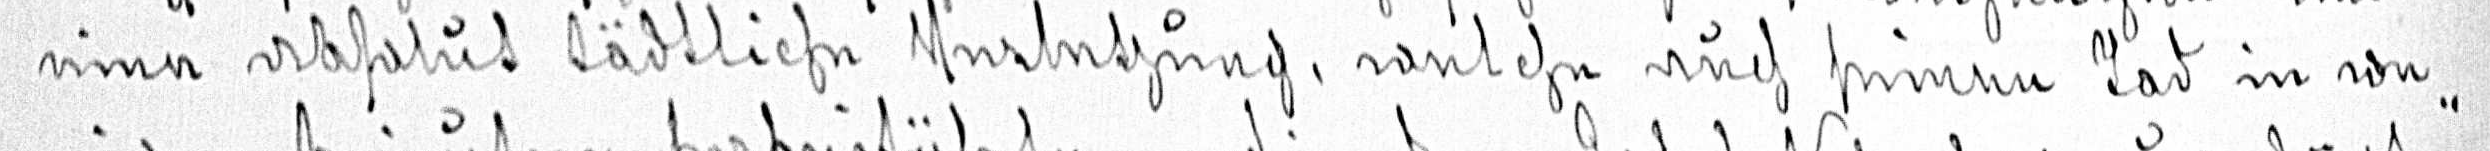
eine absolut tödtliche Verletzung, welche auch seinen Tod in we¬
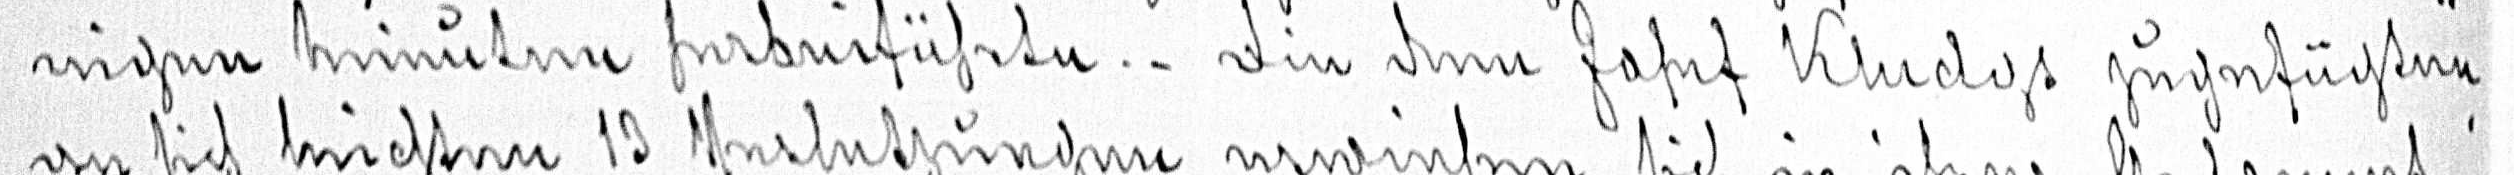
nigen Minuten herbeiführte. – Die den Josef Kludys zugefügten
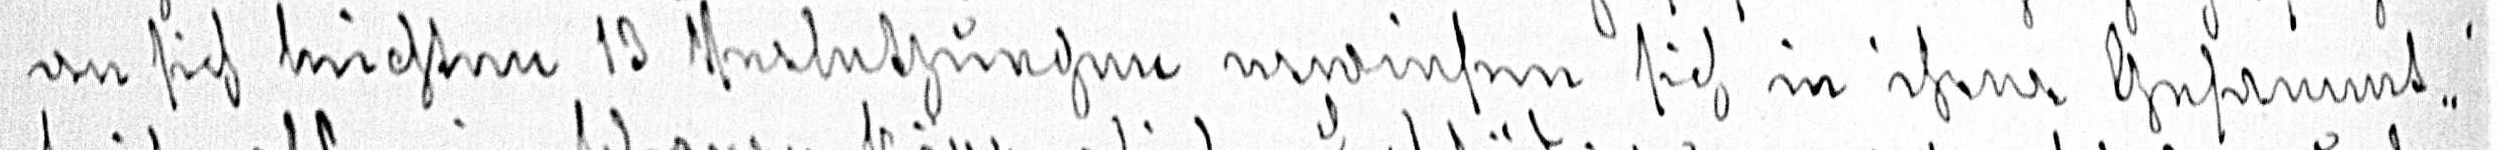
an sich leichten 13 Verletzungen erwiesen sich in ihrer Gesammt¬
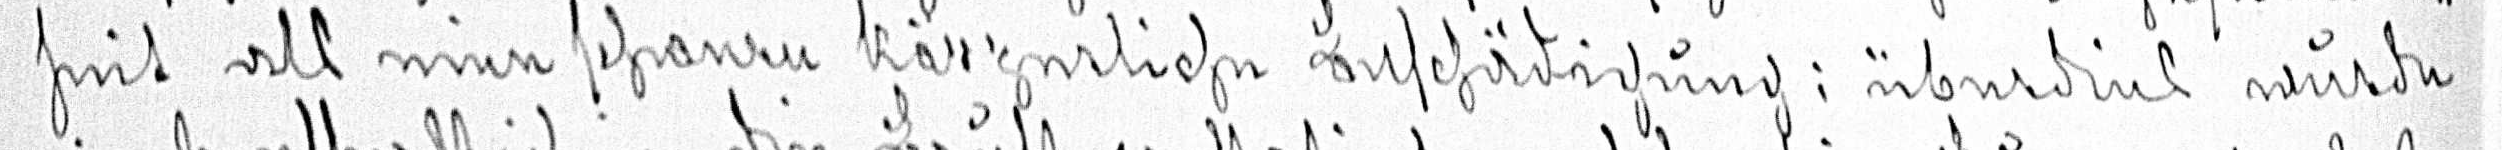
heit als eine schwere körperliche Beschädigung; überdies wurde
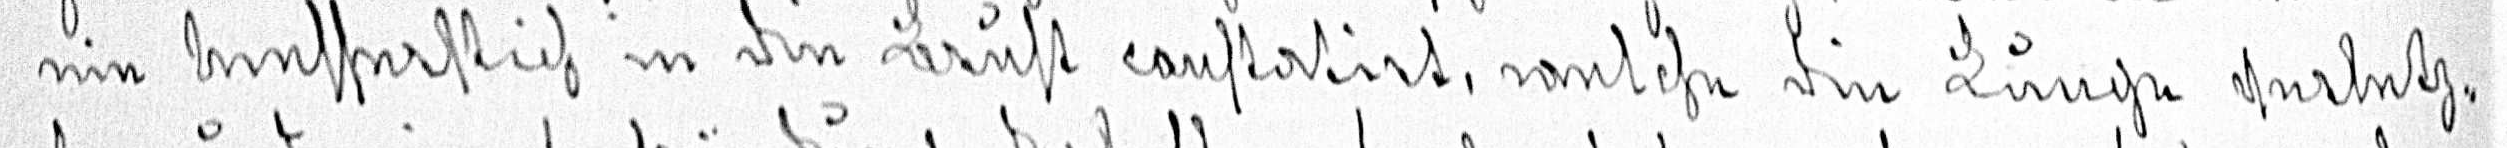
ein Messerstich in die Brust constatirt, welche die Lunge verletz¬
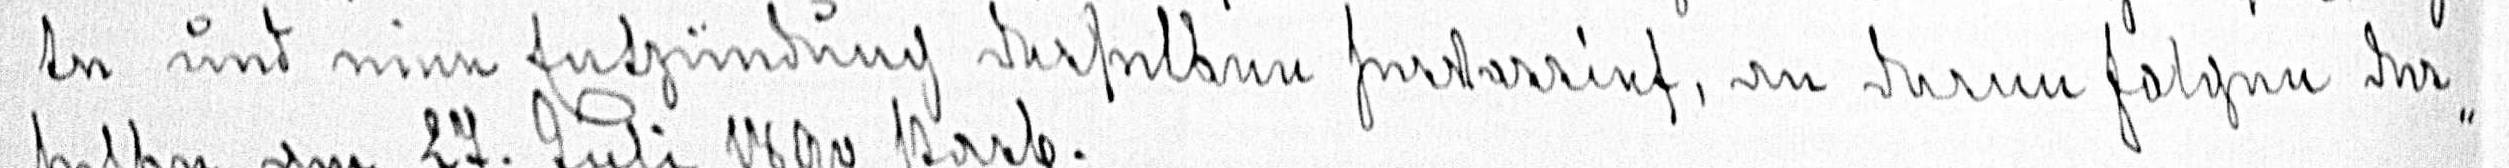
te und eine Entzündung derselben hervorrief, an deren Folgen der¬
